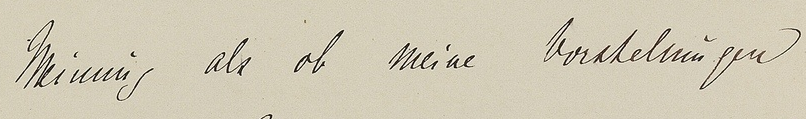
Meinung als ob meine Vorstellungen
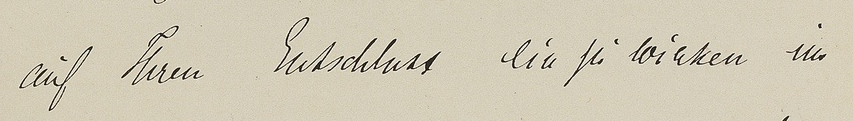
auf Ihren Entschluss einzuwirken im
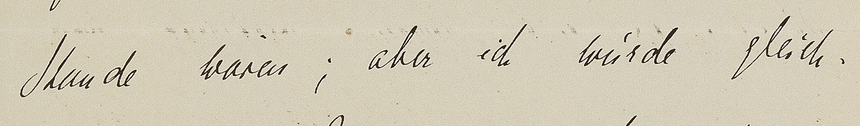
Stande wären; aber ich würde gleich-
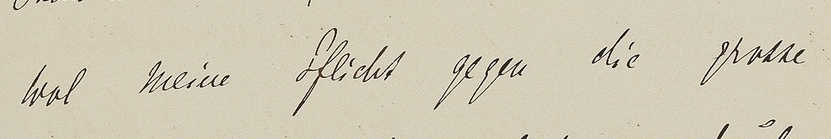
wol meine Pflicht gegen die grosse
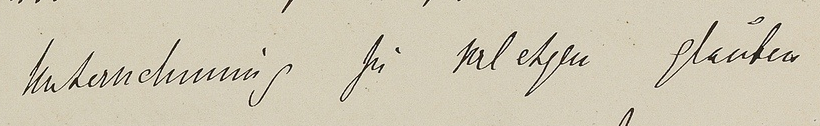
Unternehmung zu verletzen glauben
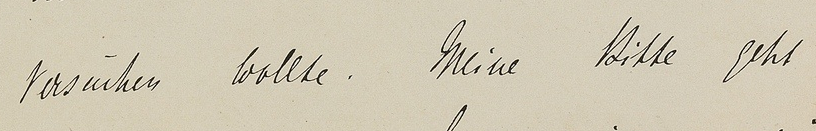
versuchen wollte. Meine Bitte geht
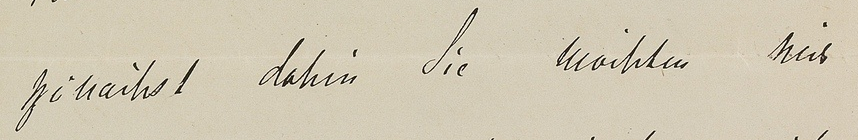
zunächst dahin Sie möchten mir
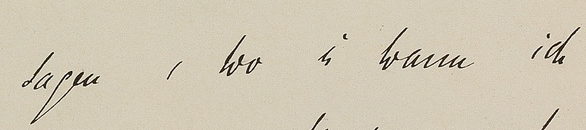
sagen, wo u wann ich
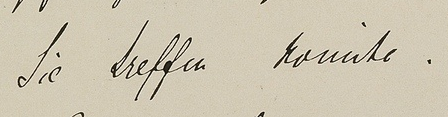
Sie treffen könnte.
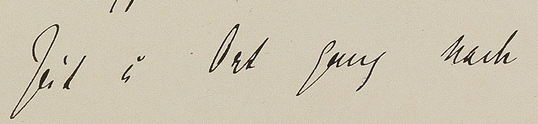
Zeit u Ort ganz nach
